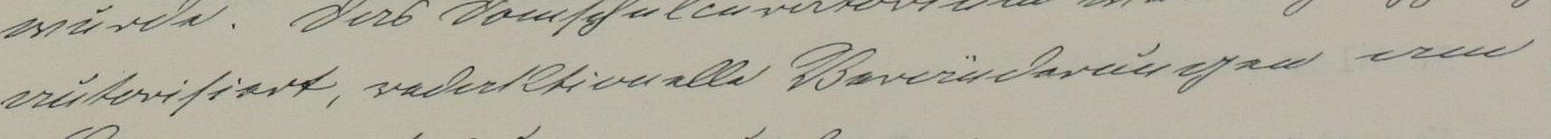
autorisiert, redaktionelle Veränderungen am
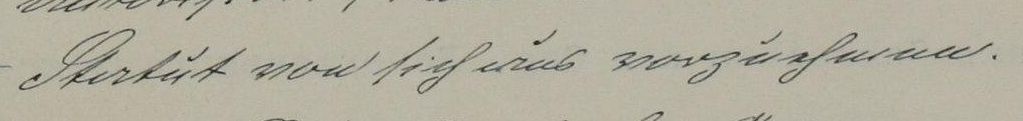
Statut von sich aus vorzunehmen.
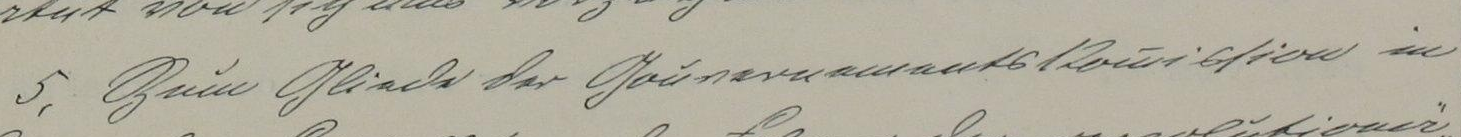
5. Zum Gliede der Gouvernementskommission in
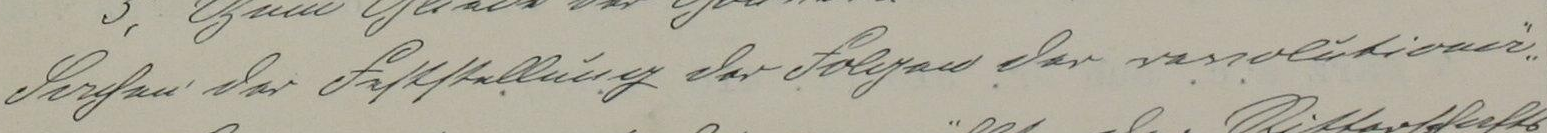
Sachen der Feststellung der Folgen der revolutionä-
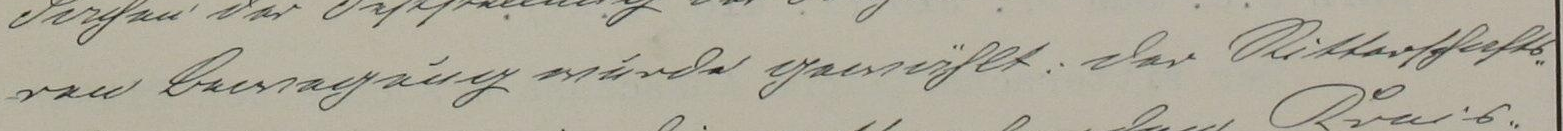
ren Bewegung wurde gewählt: der Ritterschafts-
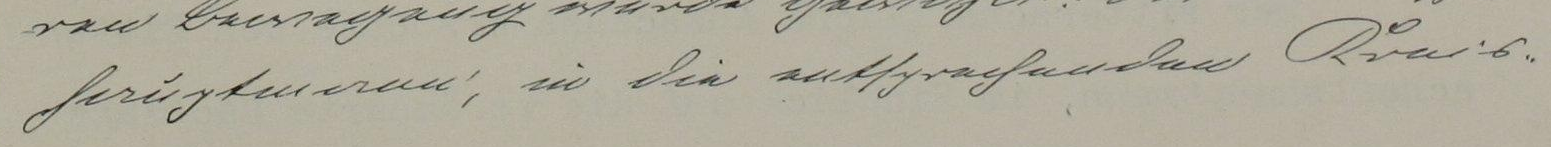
hauptmann; in die entsprechenden Kreis-
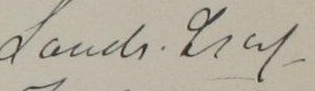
Landr. Graf
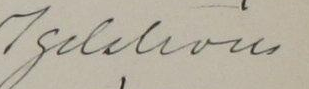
Igelstrom
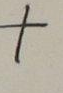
†
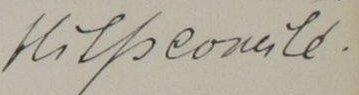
Hilfscomité
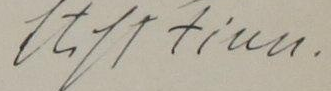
Stift Finn
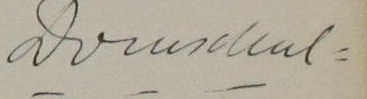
Domschul-
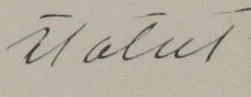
statut
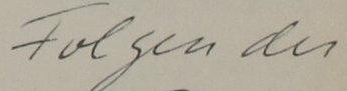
Folgen der
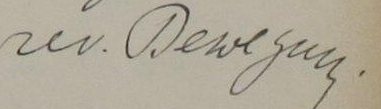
rev. Bewegung
